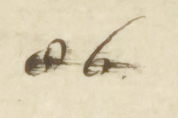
86.
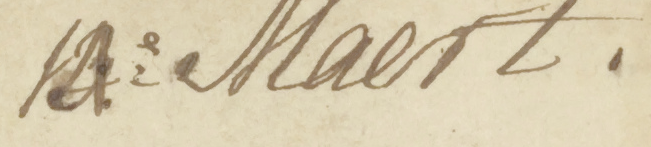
14e Maert.
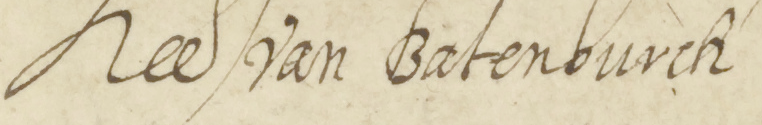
heer van Batenburch
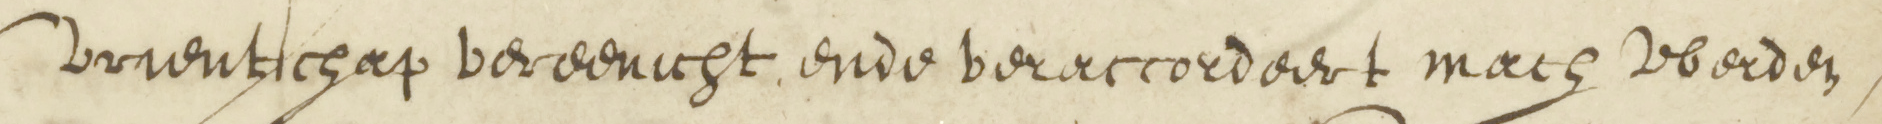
vrientschap vereenicht ende veraccordeert mach werden.
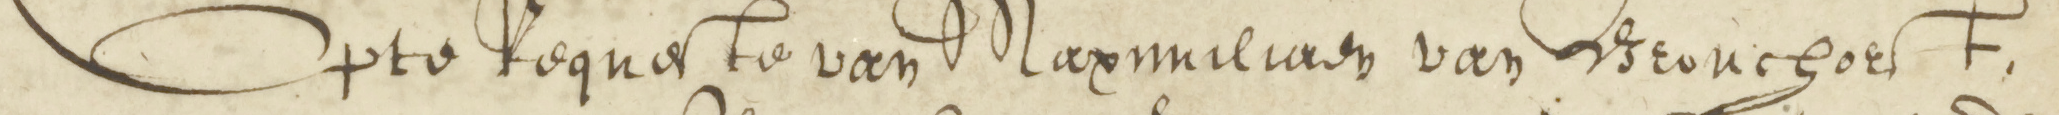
Opte Requeste van Maximiliaen van Bronchorst,
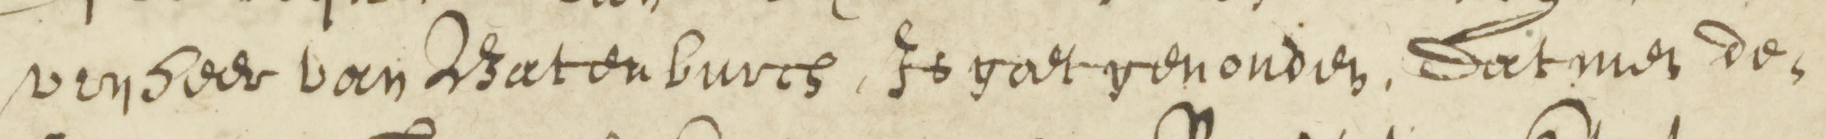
vryheer van Batenburch, is goetgeuonden, dat men de,,
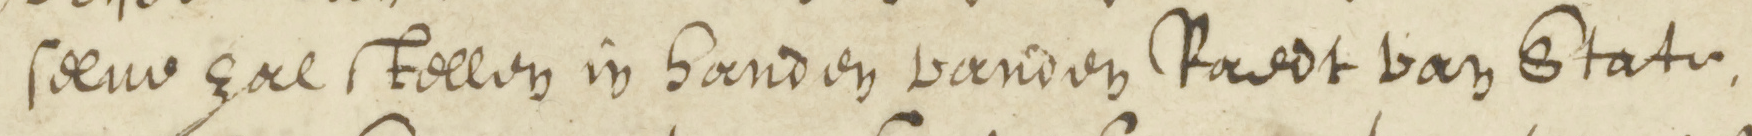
selue zal stellen in handen vanden Raedt van State,
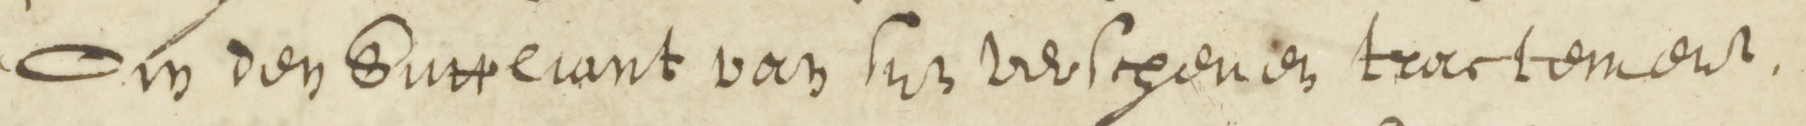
om den Suppliant van syn verschenen tractement,
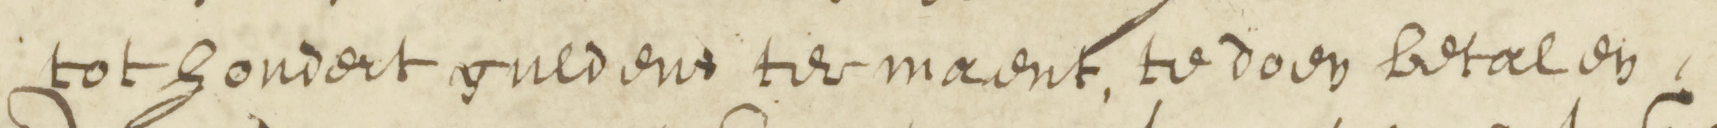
tot hondert guldens ter maent, te doen betalen.
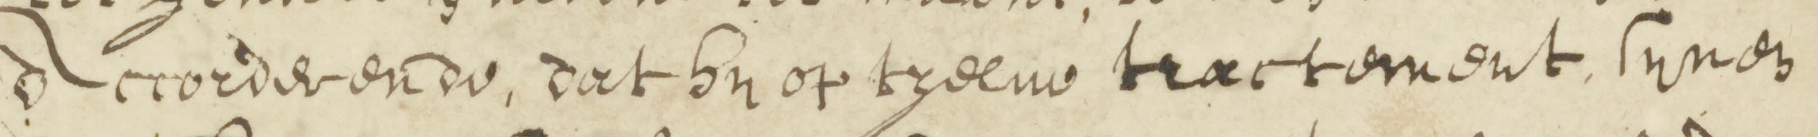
Acoorderende, dat hy op tzelue tractement synen
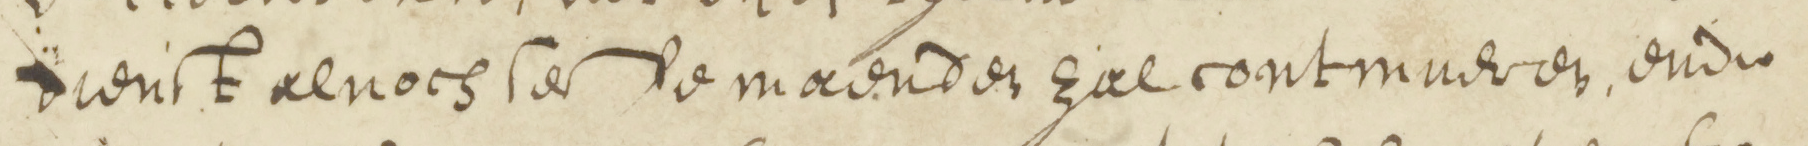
dienst alnoch sesse maenden zal continueren, ende
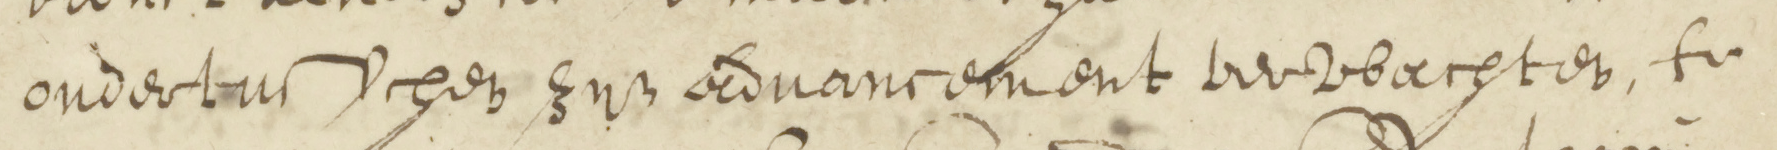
ondertusschen zyn aduancement verwachten, te
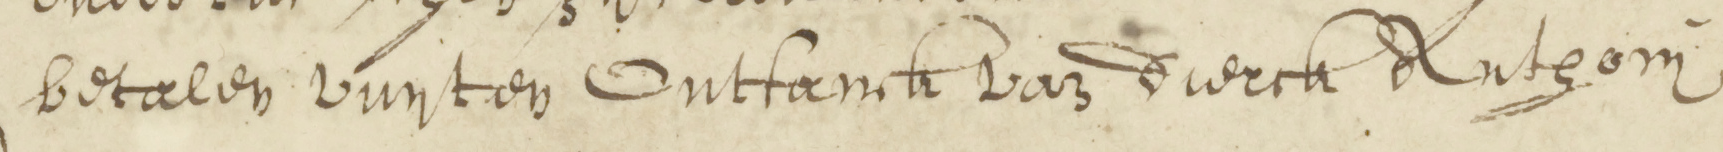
betalen vuyten ontfanck van dierck Anthonij
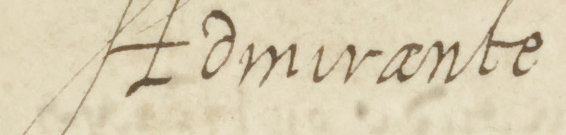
Admirante
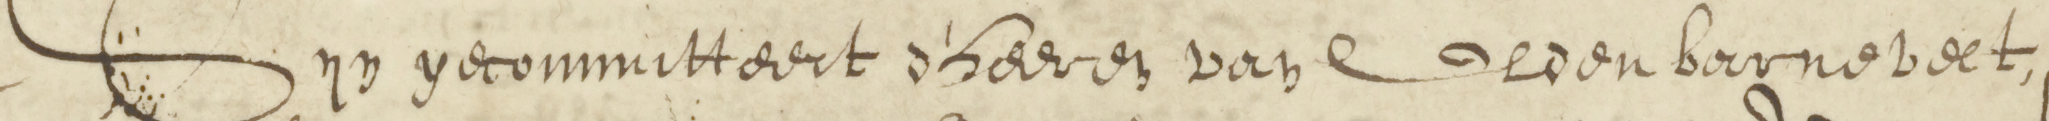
Syn gecommitteert d'heeren van Oldenbarnevelt,
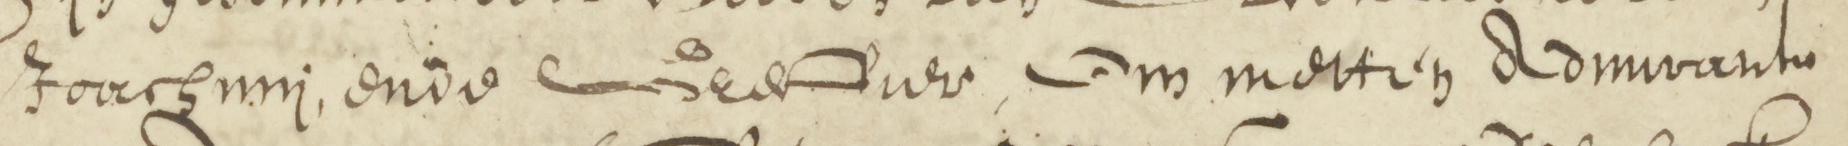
Joachimi, ende Greffier, om metten Admirante
